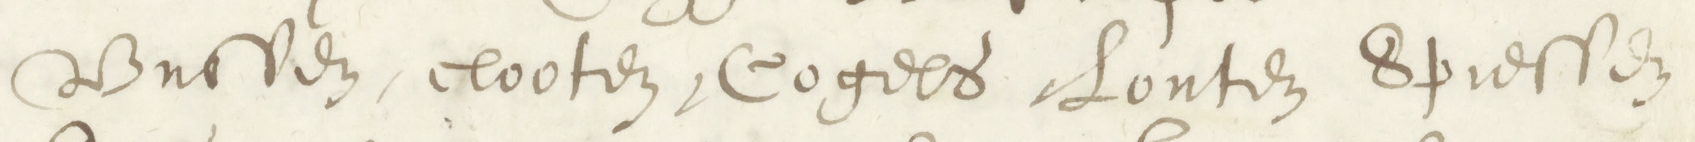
Bussen, clooten, Cogels, Lonten Spiessen
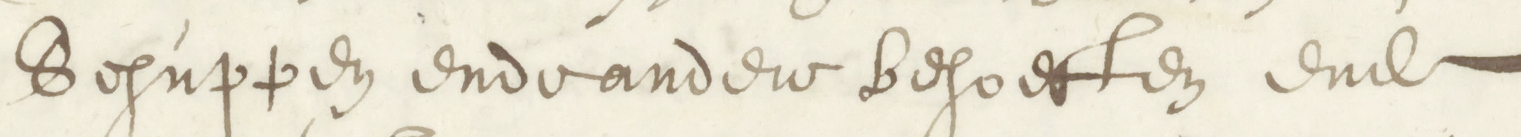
Schuppen ende ander behoeften ende
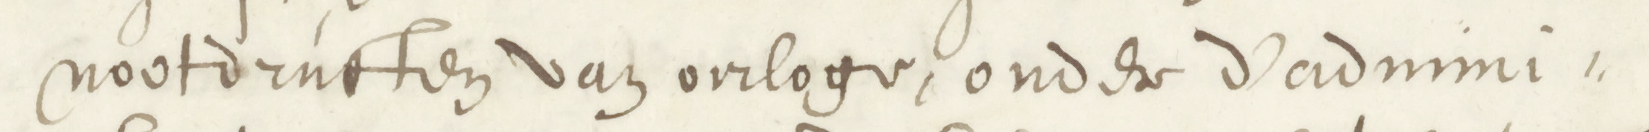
nootdruften van oirloge, onder d'admini„
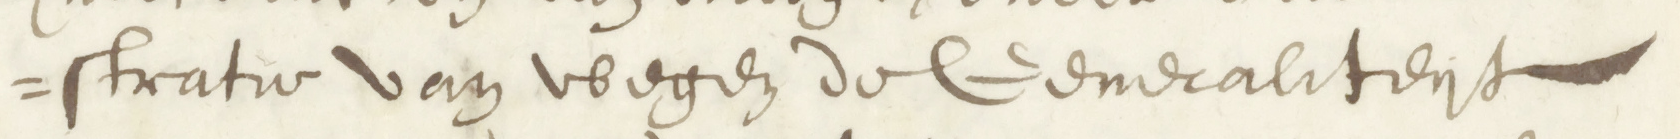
=stratie van wegen de Generaliteyt
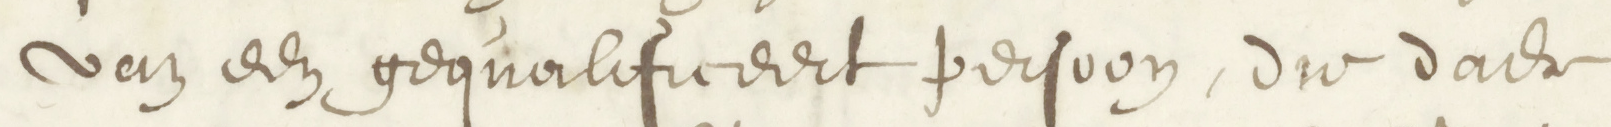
van een gequalificeert persoon, die daer
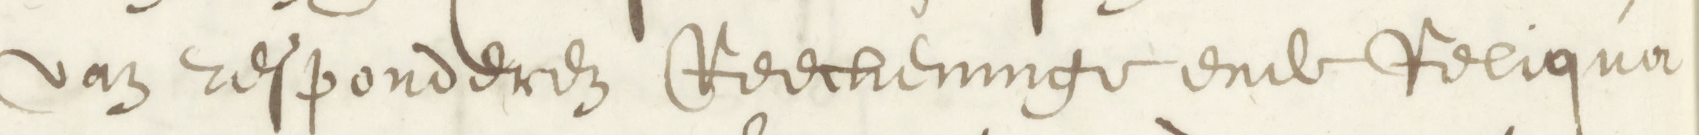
van responderen Reeckeninge ende Reliqua
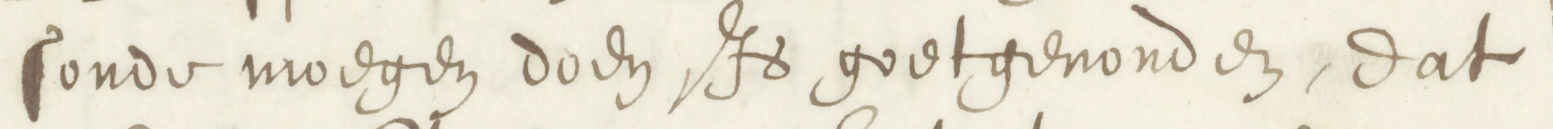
soude moegen doen, Is goetgevonden, dat
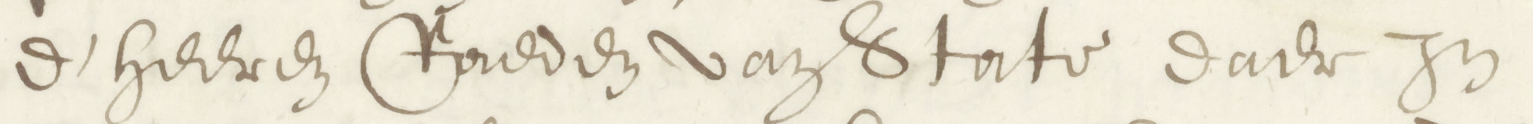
d'heeren Raeden van State daer In
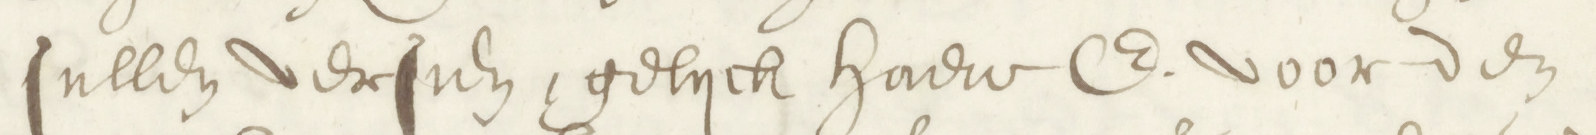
sullen versien, gelyck haere E. voor den
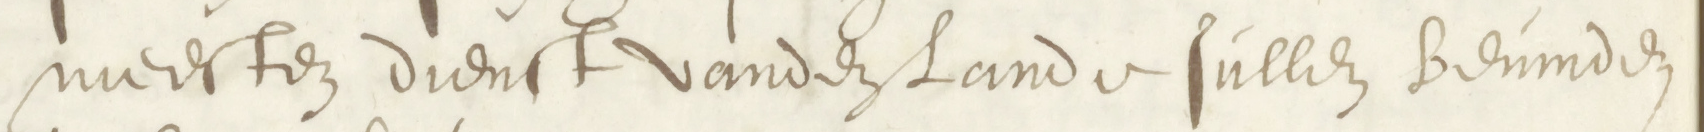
meesten dienst vanden Lande sullen beuinden
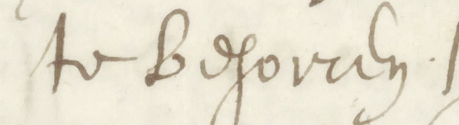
te behoiren.
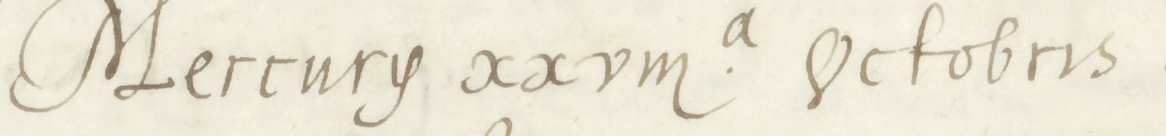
Mercury xxvija Octobris
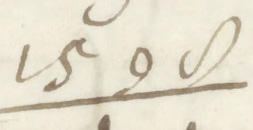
1598
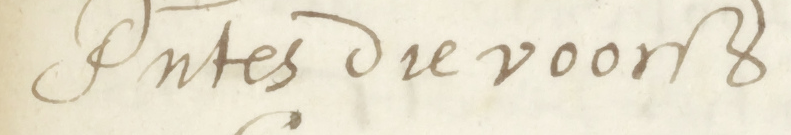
Pntes die voors
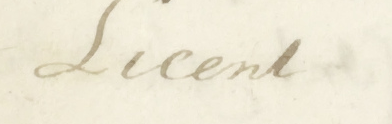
Licent
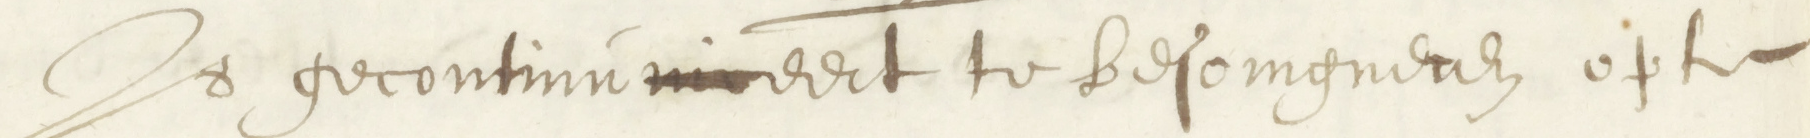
Is gecontinunieert te besoingneren opte
